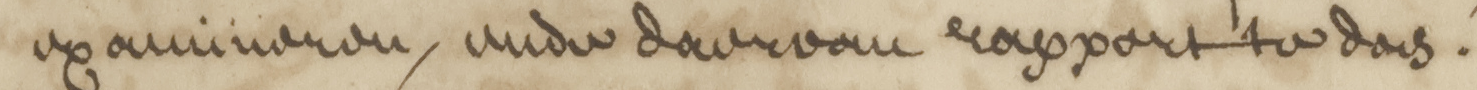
examineren, ende daervan rapport te doen.
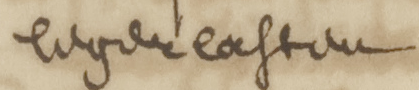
legerlasten
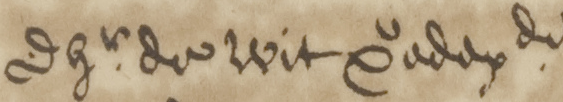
Dhr. de Wit Gedepden.
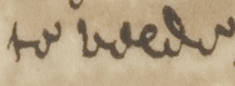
te velde
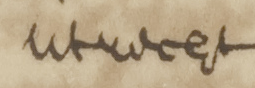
Utrecht
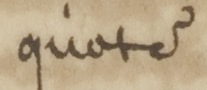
quote
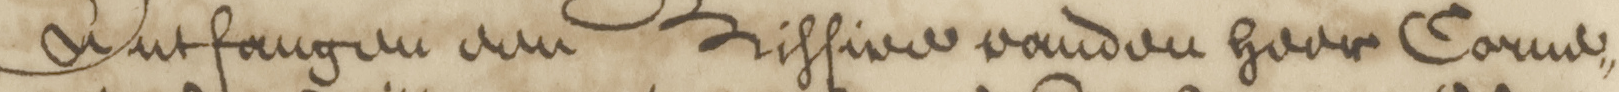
Ontfangen een Missive vanden heer Corne,,
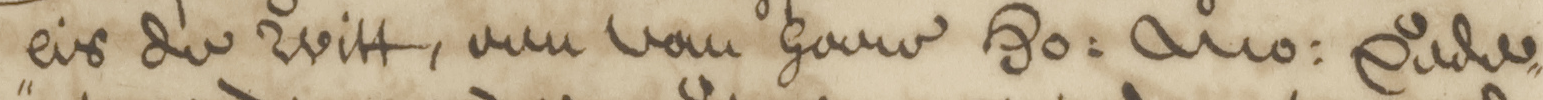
lis de Witt, een van hare Ho:Mo: Gede„
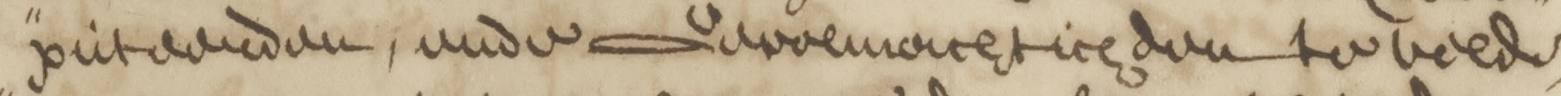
,,puteerden, ende Gevolmachtichden te velde
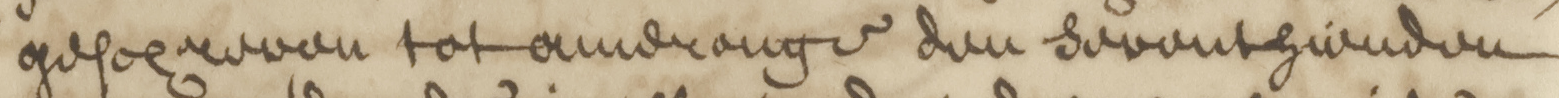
geschreven tot ameronge den seventhienden
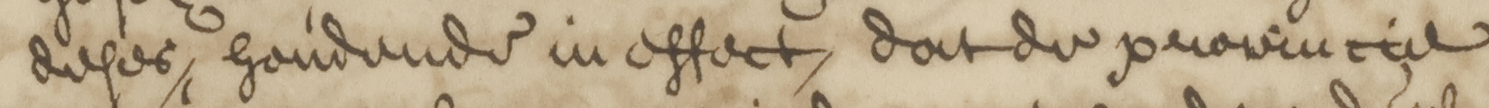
deses, houdende in effect, dat de provincie
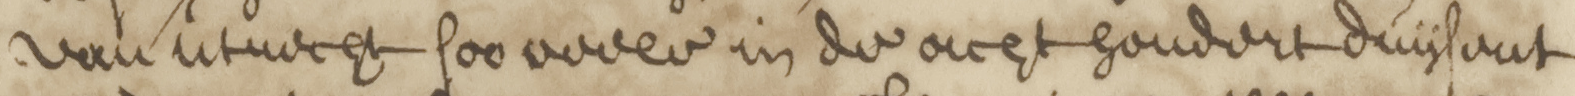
van Utrecht soo veele in de achthondert duijsent
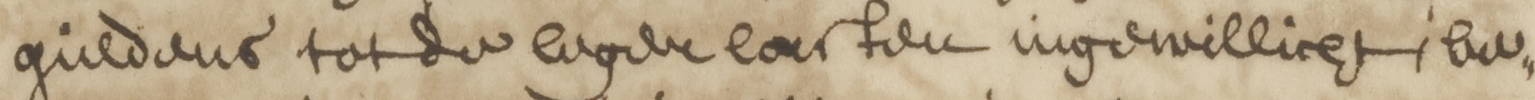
guldens tot de leger lasten ingewillicht, be„
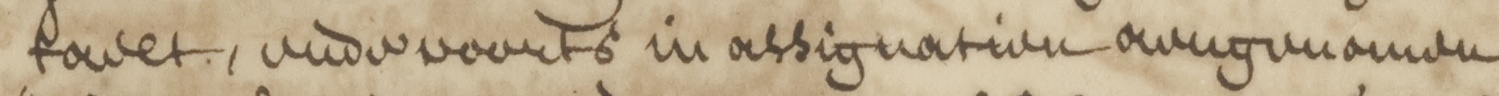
taelt, ende voorts in assignatien aengenomen
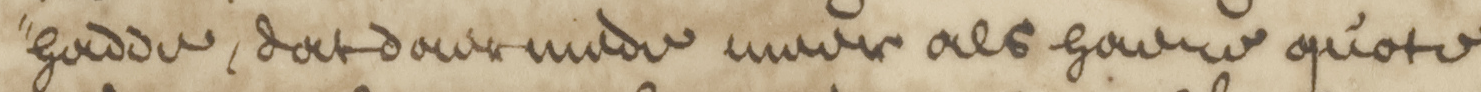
hadde, dat daermede meer als haere quote
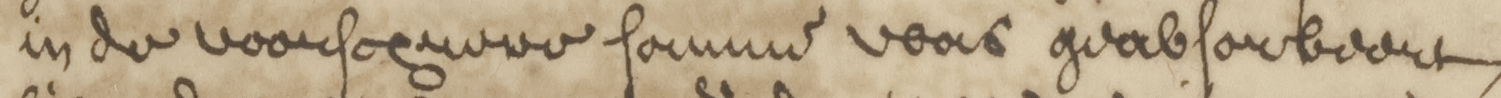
in de voorschreve somme was geabsorbeert
